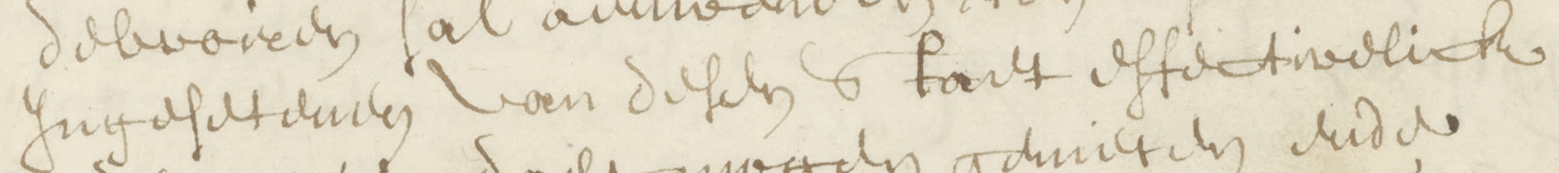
Ingesetenen van desen Staet effectivelick
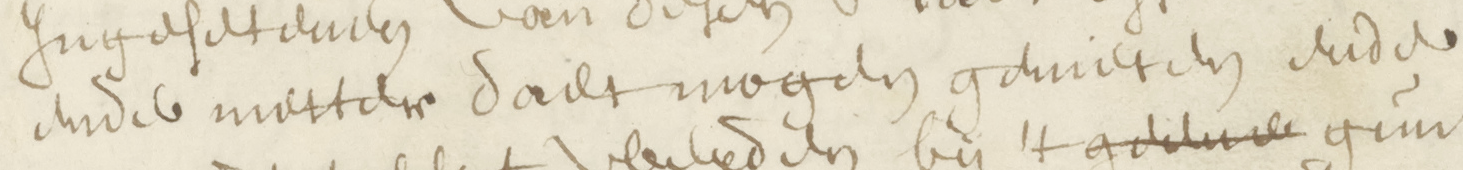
ende metter daet mogen genieten ende
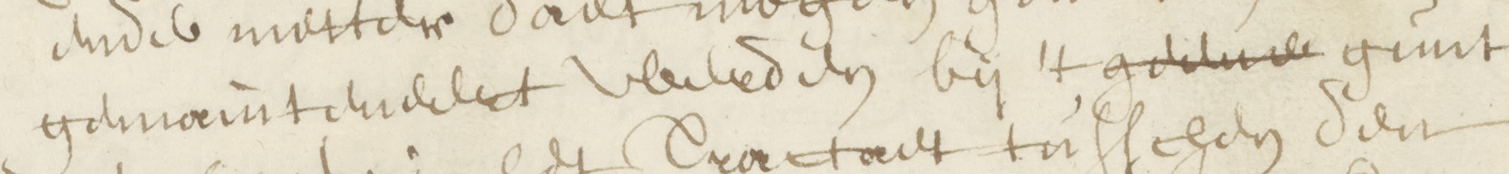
gemainteneert werden bij 't geene gunt
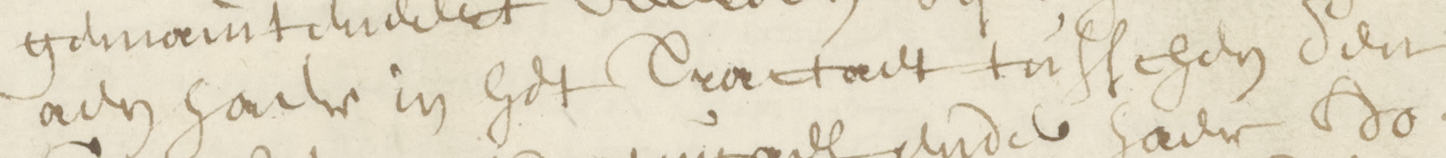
aen haer in het Tractaet tusschen den
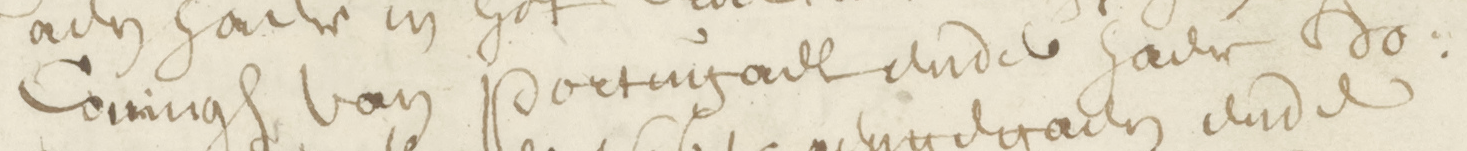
Coningh van Portugael ende haer Ho:
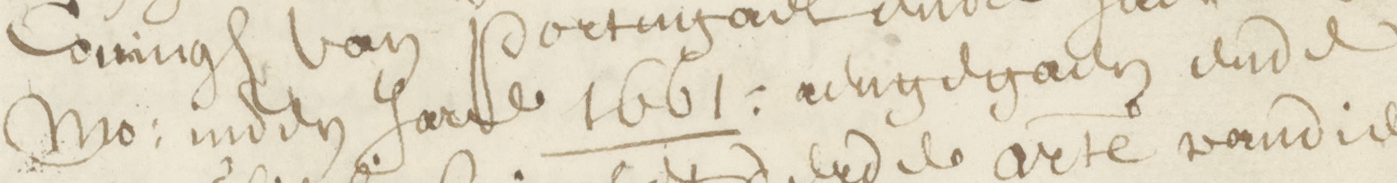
Mo: inden Jare 1661: aengegaen ende
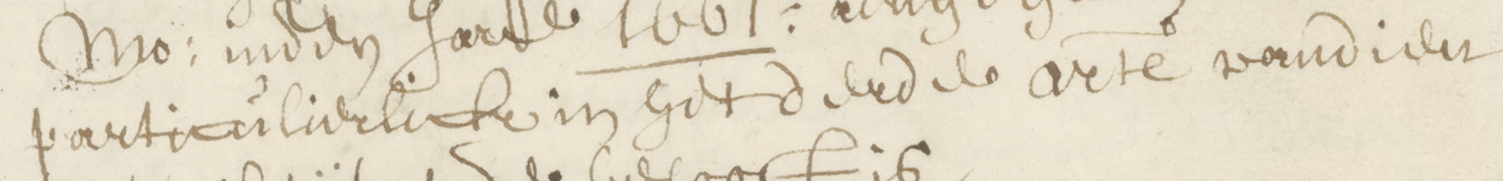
particulierlick in het derde artl vandien
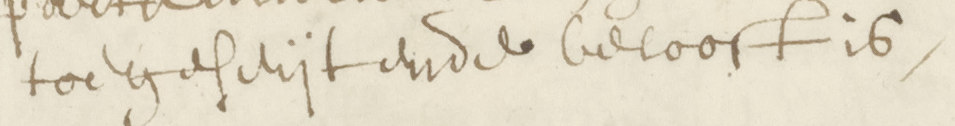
toegeseijt ende belooft is,
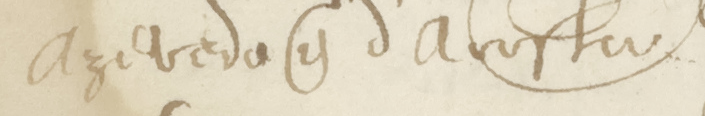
Azevedo & d'Acosta,
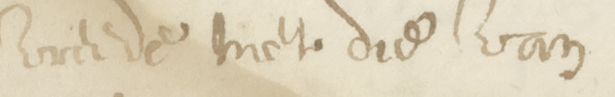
vreede met die van
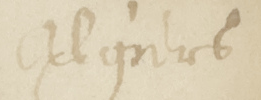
Algiers
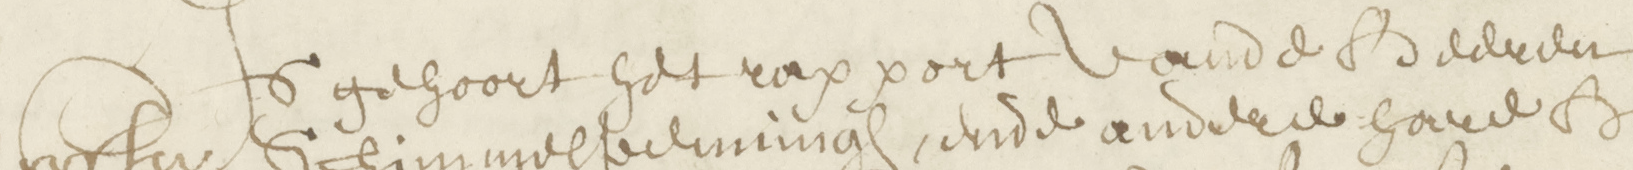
Is gehoort het rapport vande Heeren
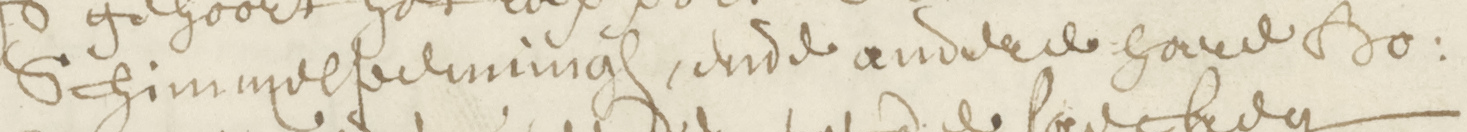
Schimmelpenningh, ende andere hare Ho:
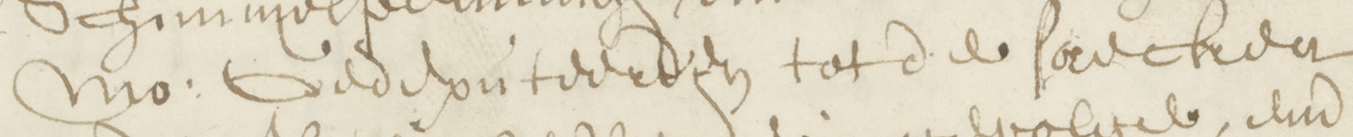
Mo: Gedeputeerden tot de saecken
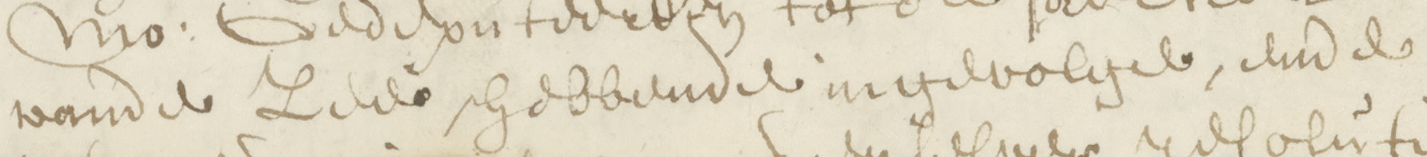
vande zee, hebbende ingevolge, ende
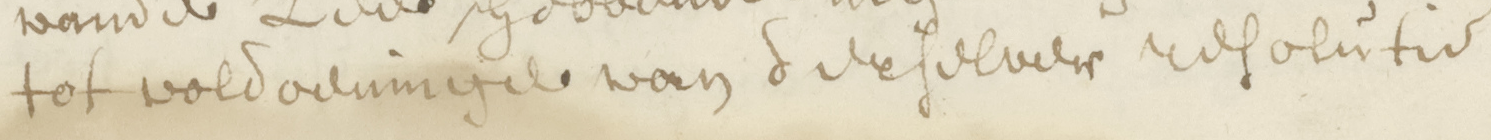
tot voldoeninge van derselver resolutie
